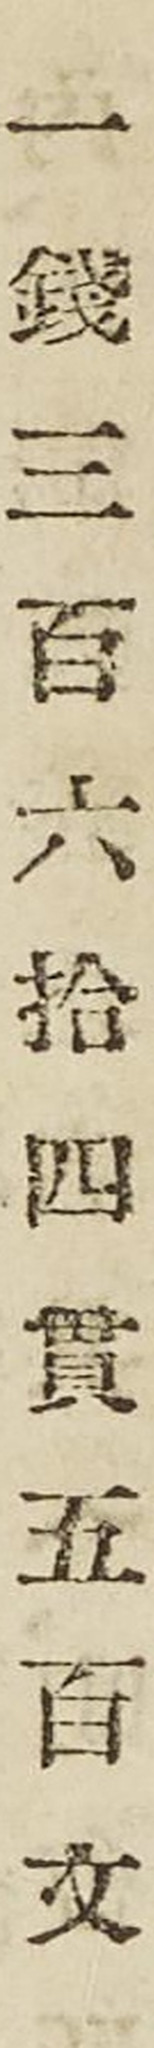一銭三百六十四貫五百文
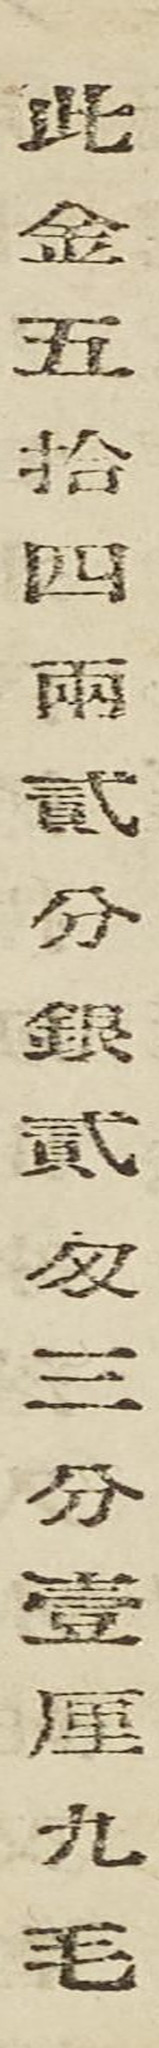此金五十四両二分銀二匁三分一厘九毛
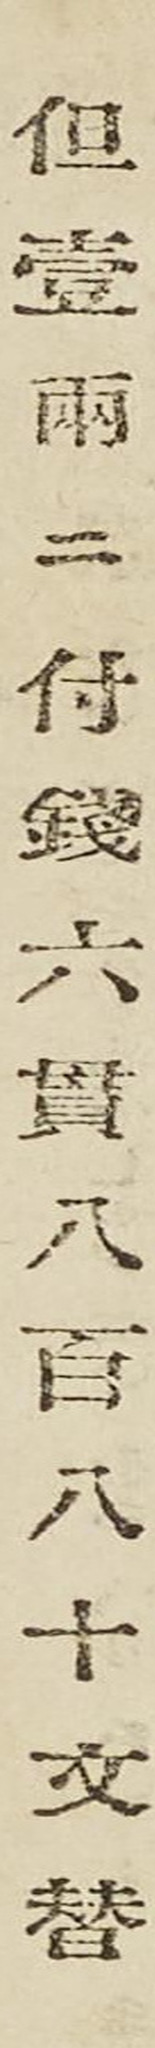但一両二付銭六貫八百八十文替
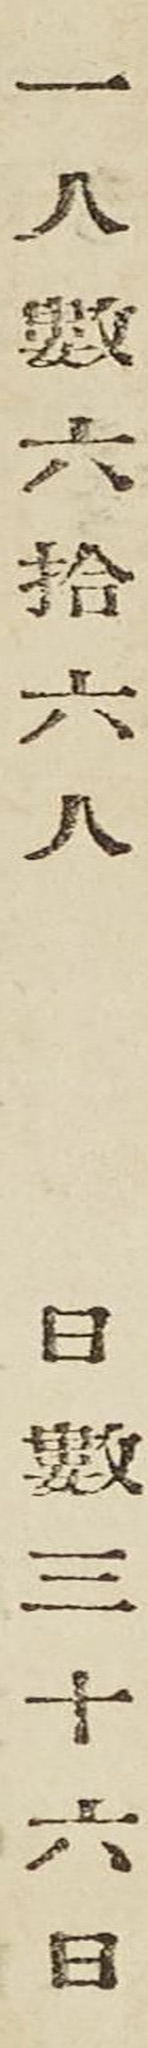一人数六十六人日数三十六日
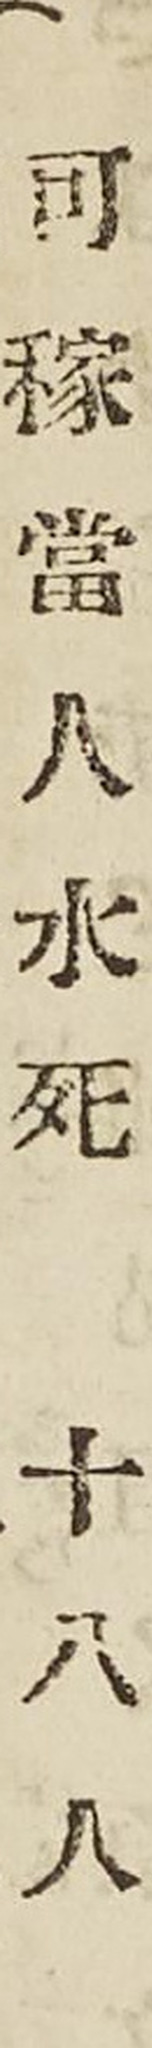可稼当人水死十八人
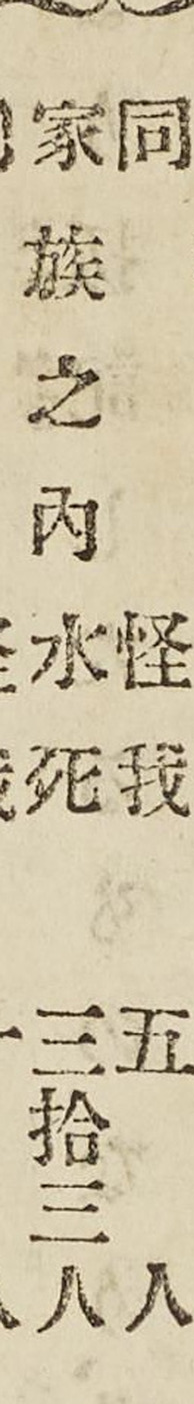家族之内水死三十三人
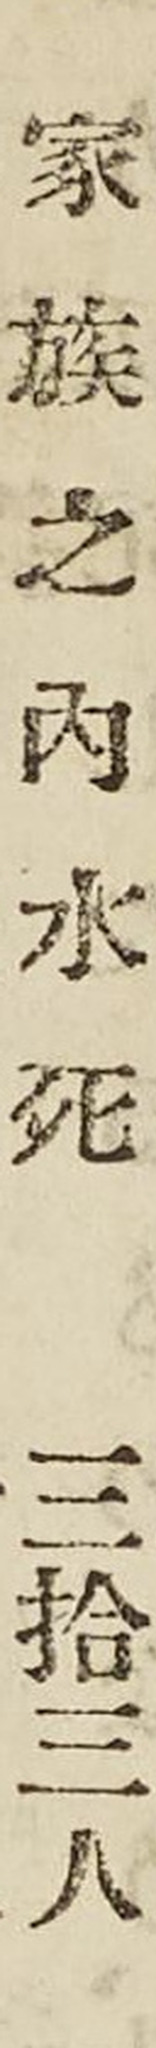家族之内水死三十三人
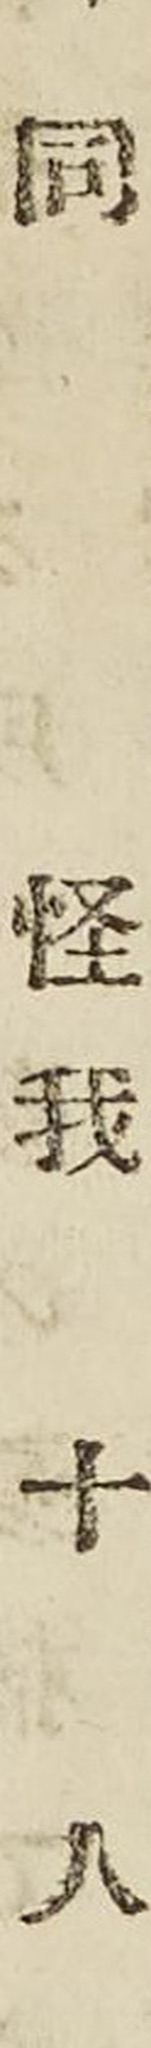同怪我十人
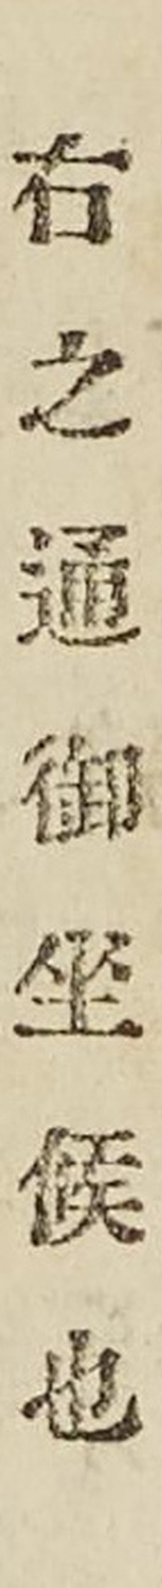右之通御坐候也
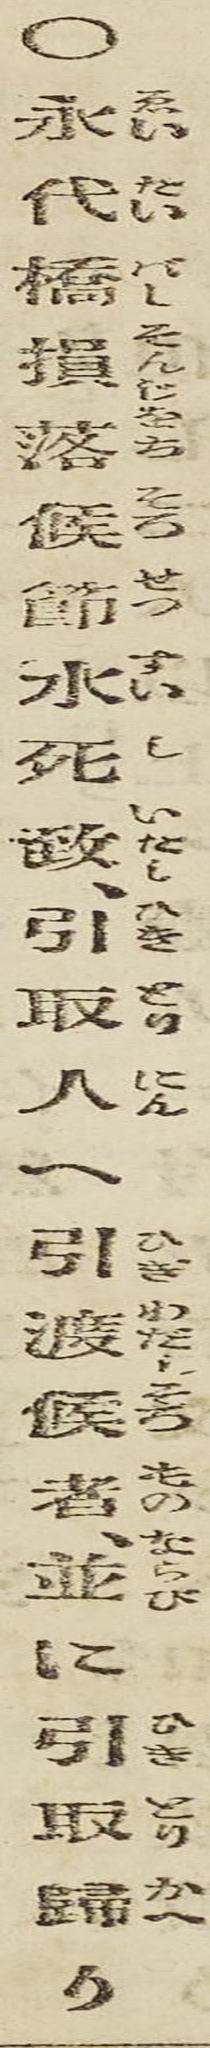○永代橋損落候節水死致、引取人へ引渡候者、並に引取帰り
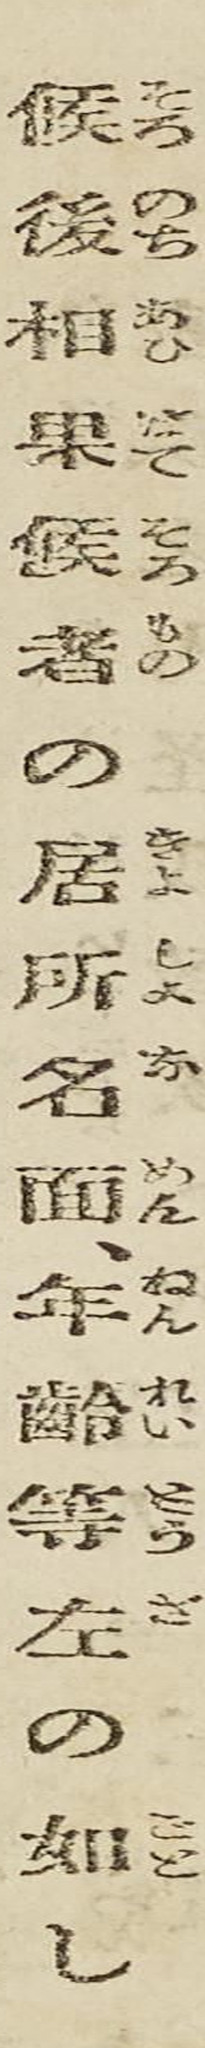候後相果候者の居所名面、年齢等左の如し
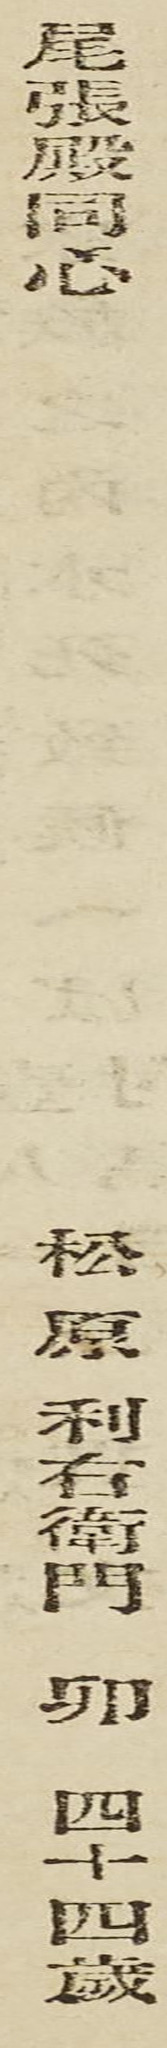一尾張殿同心松原利右衛門卯四十四歳
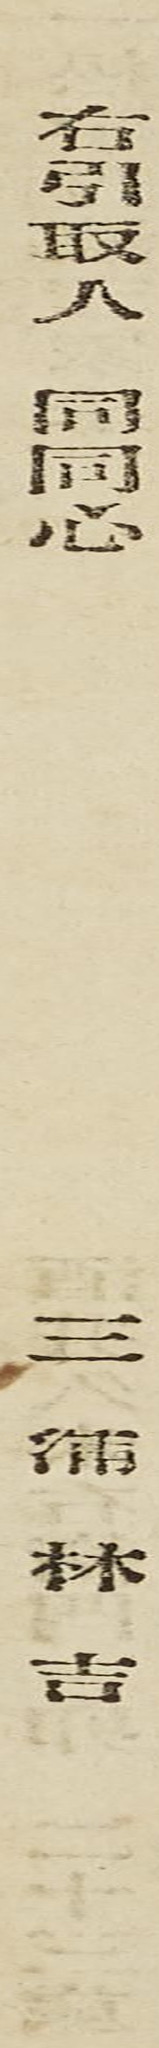右引取人同同心三浦林吉
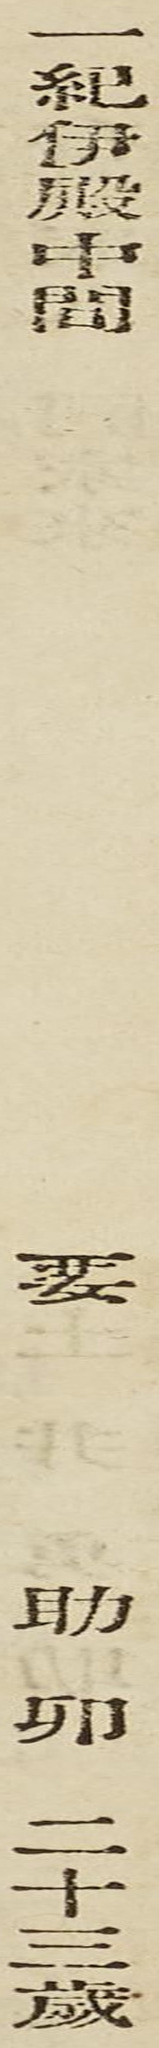一紀伊殿中間要助卯二十三歳
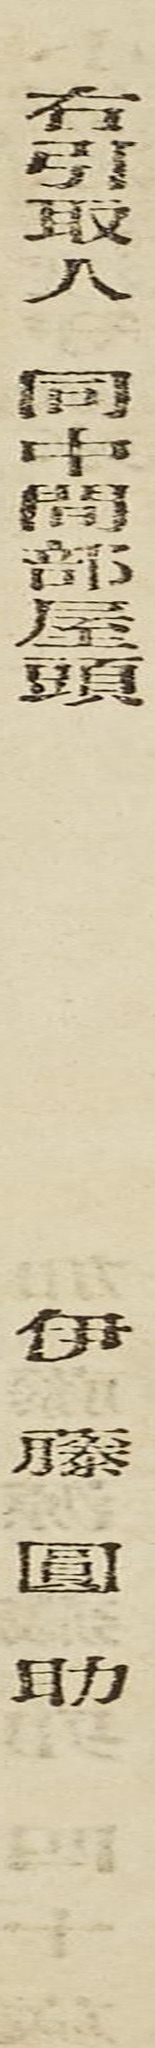右引取人同中間部屋頭伊藤圓助
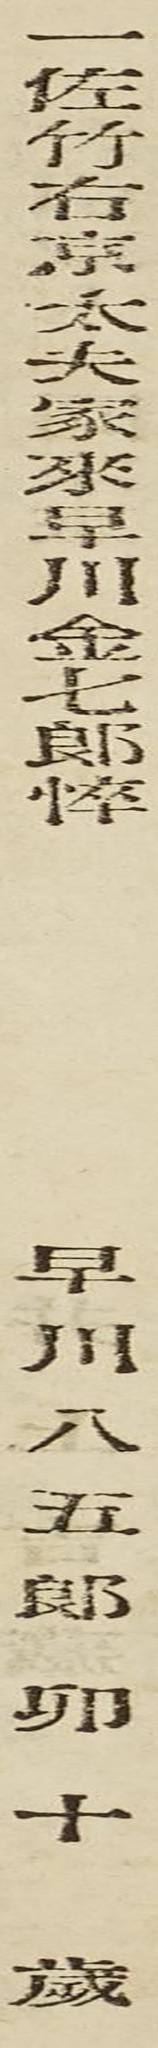一佐竹右京太夫家来早川金七郎悴早川八五郎卯十歳
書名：永代惨話　文化の夢　全
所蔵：東京大学地震研究所図書室 Earthquake Research Institute Library, The University of Tokyo, JAPAN
